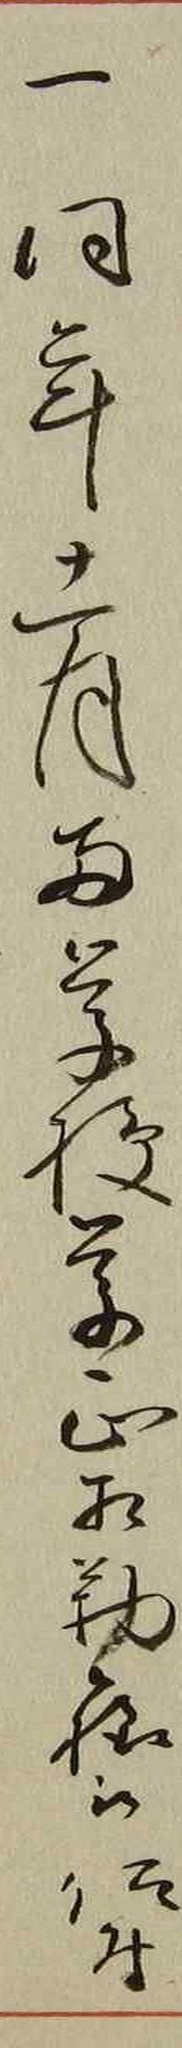一同年十一月両学校学正相勤候様被仰付
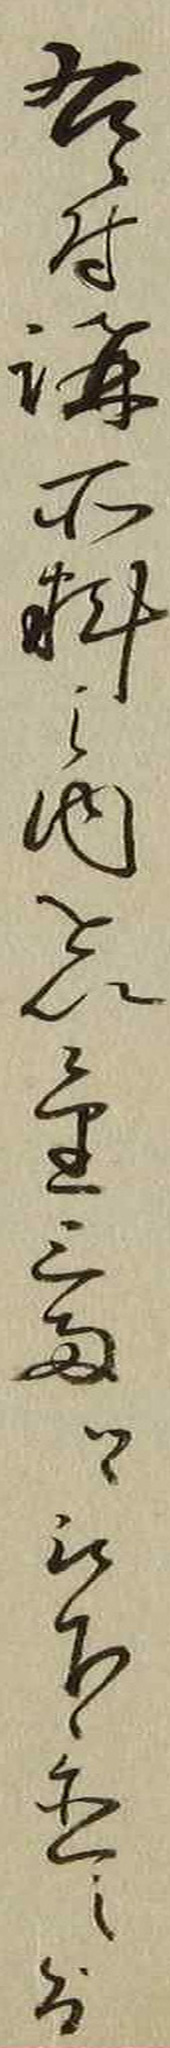右に付講所料之内を以金三両ツヽ被下置之旨
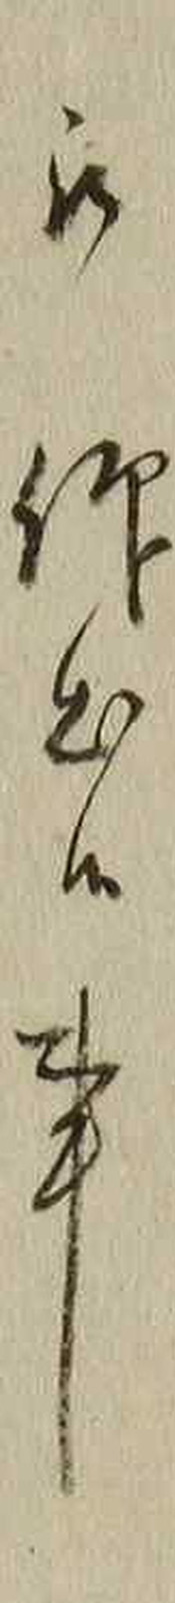被仰出候事
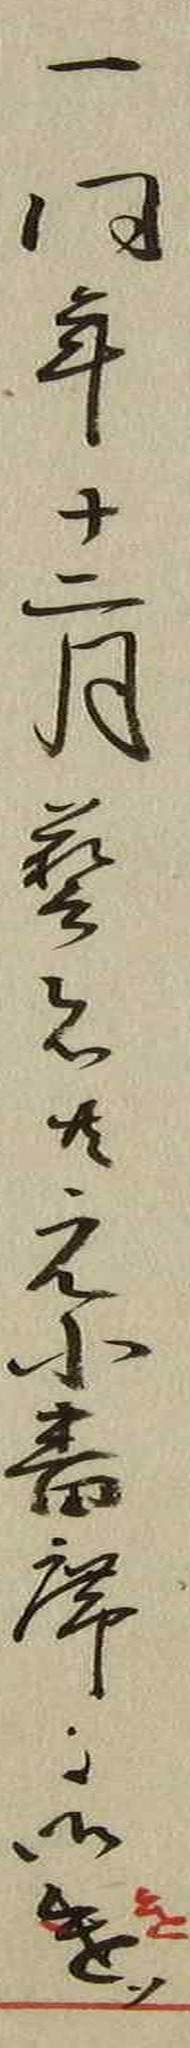一同年十二月芸者共元小番席に御遣
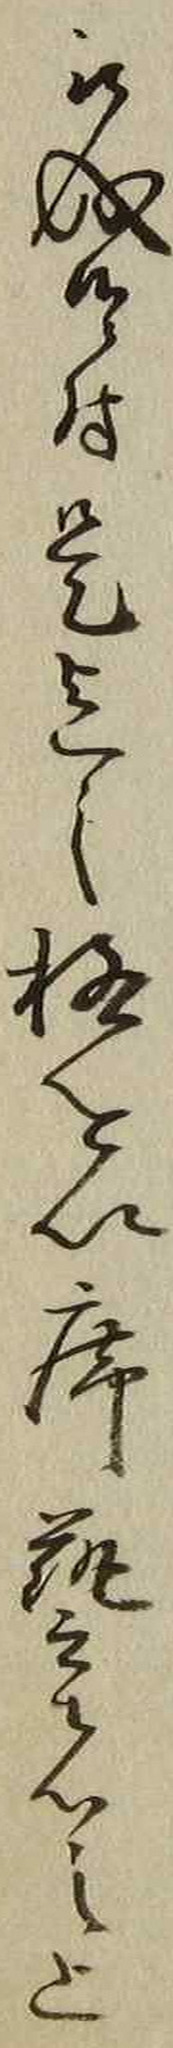被成候に付是迄之格を以席芸者之上
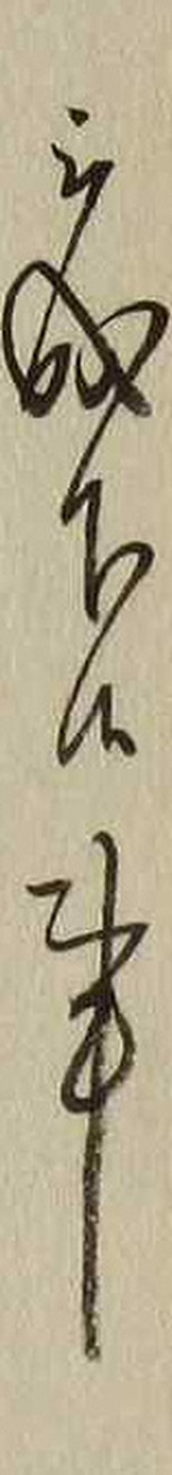被成下候事
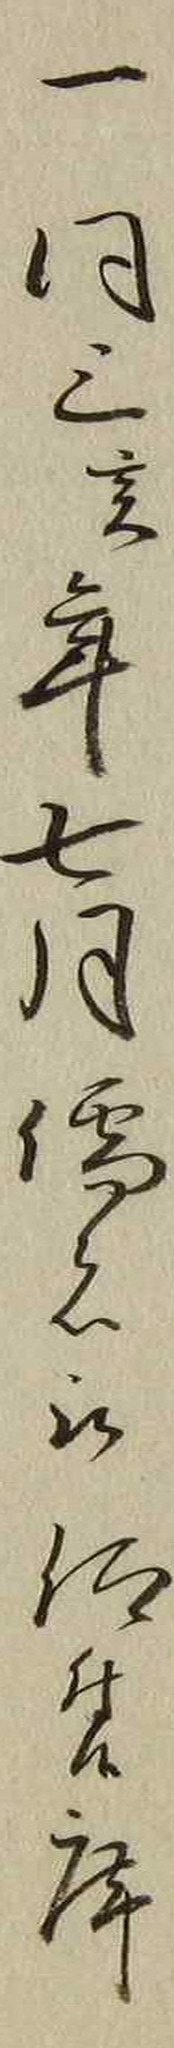一同三亥年七月儒者被仰付候席
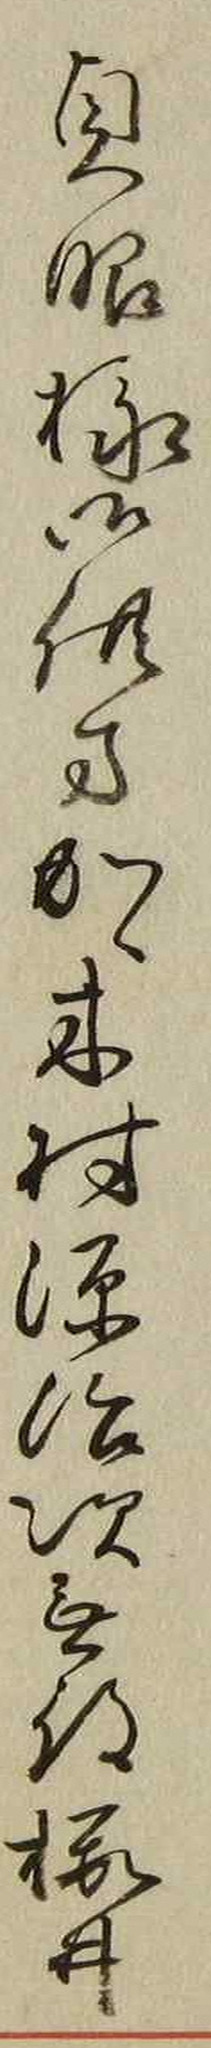貞昭様御供方加ゝ木村源治次無役桜井
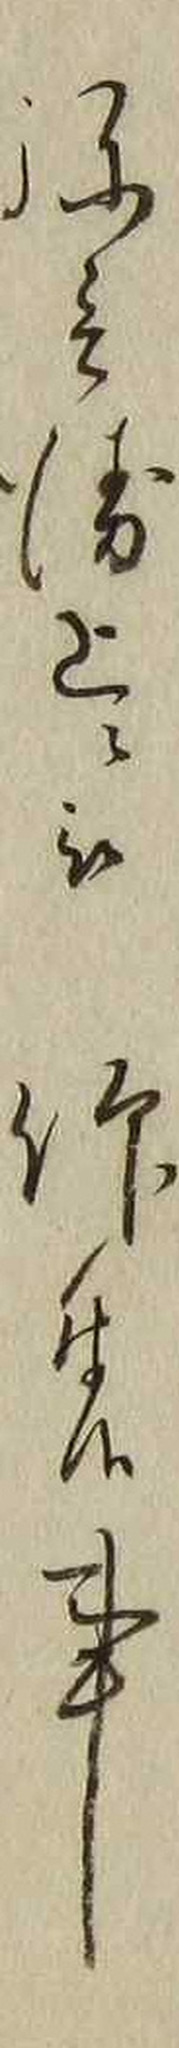弥兵衛上に被仰付候事
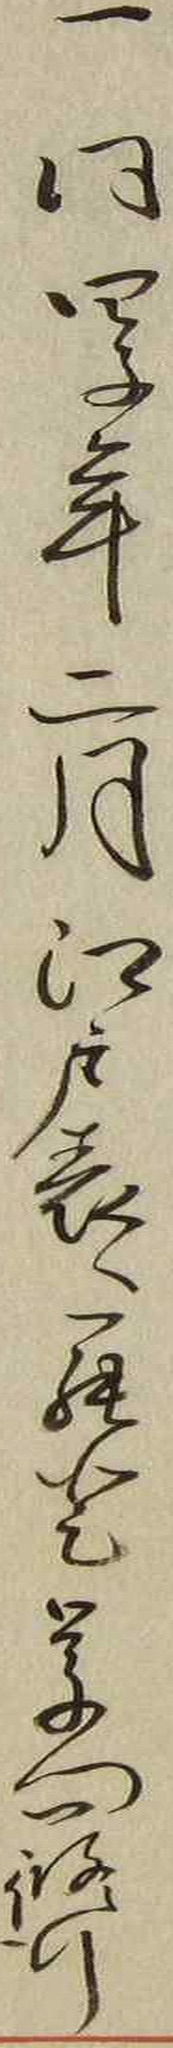一同四子年二月江戸表へ罷登学問修行
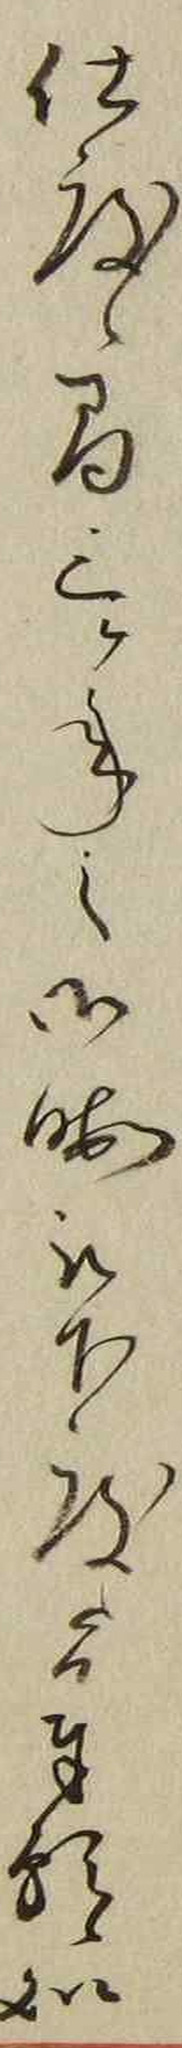仕度候間三ヶ年之御暇被下度旨奉願候処

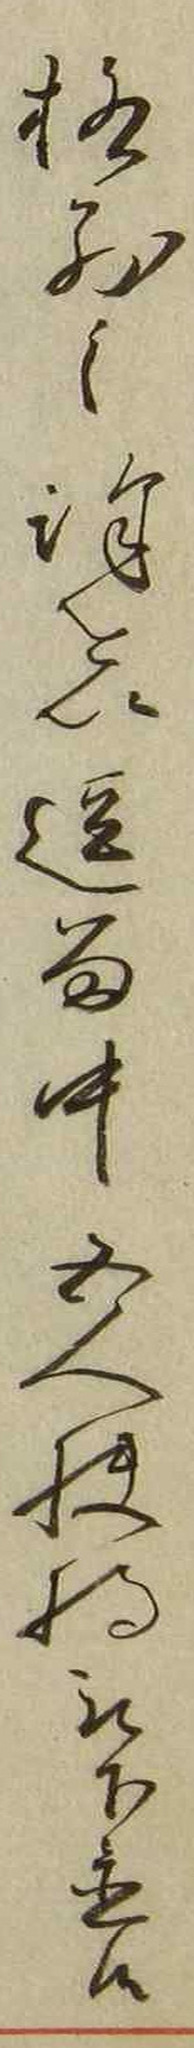格別之訳を以逗留中五人扶持被下置候
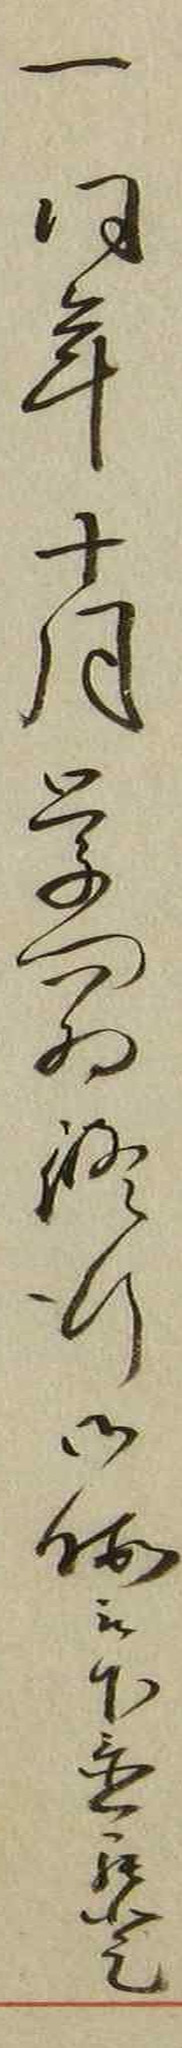一同年十月学問為修行御暇被下置罷登
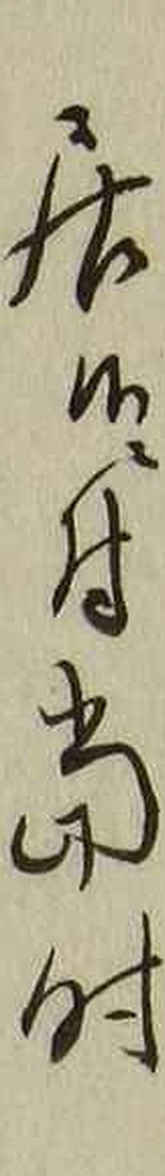居候に付当時
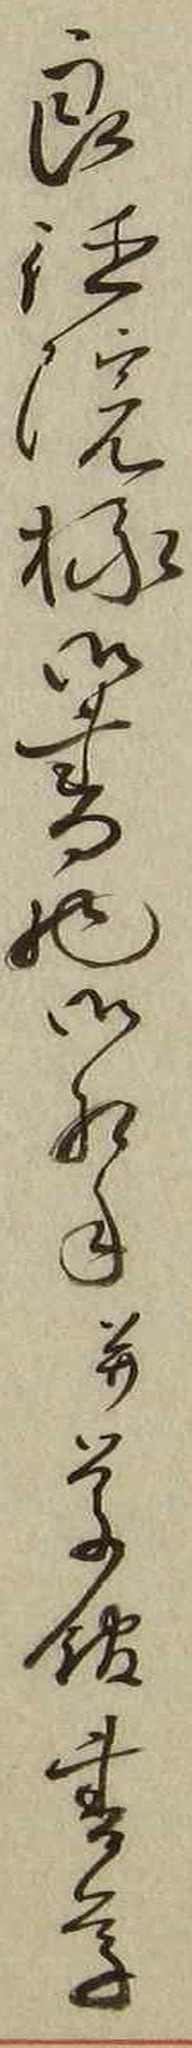良徳院様御書物御相手幷学館書学
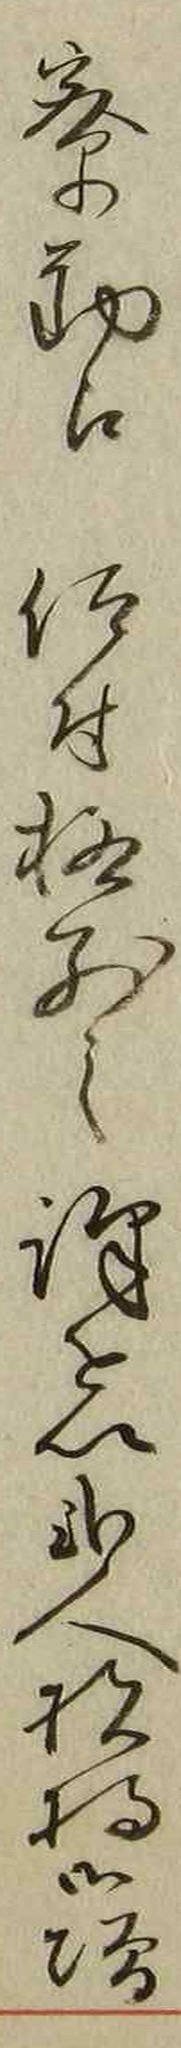寮勤被仰付格別之訳を以弐人扶持御増
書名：諸士系譜　巻之3　い之部3
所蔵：会津若松市立会津図書館
